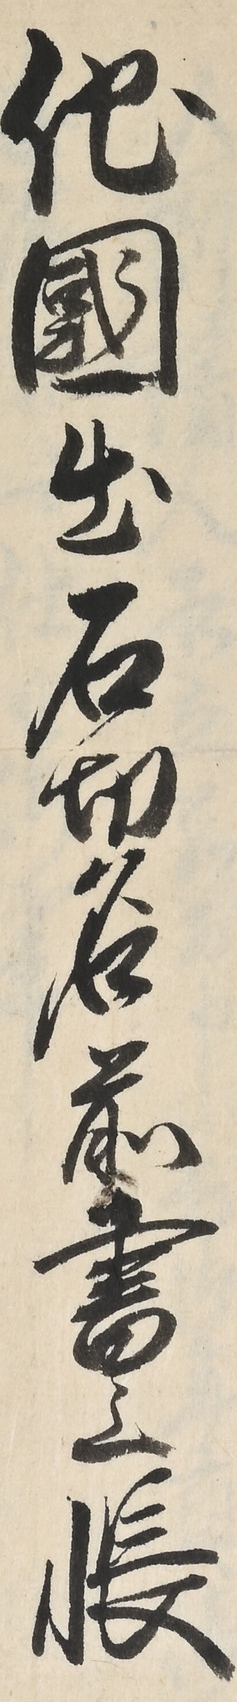他国出石切名前書上帳
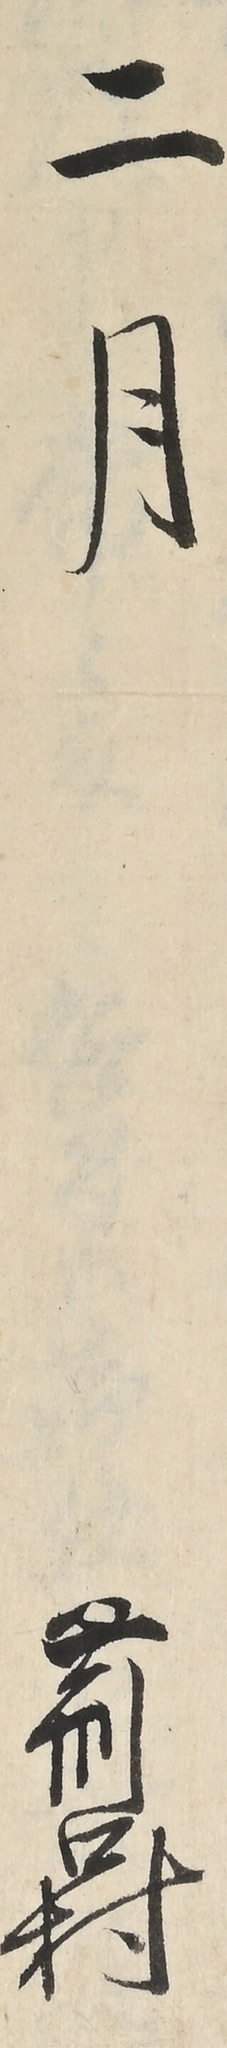二月荊口村

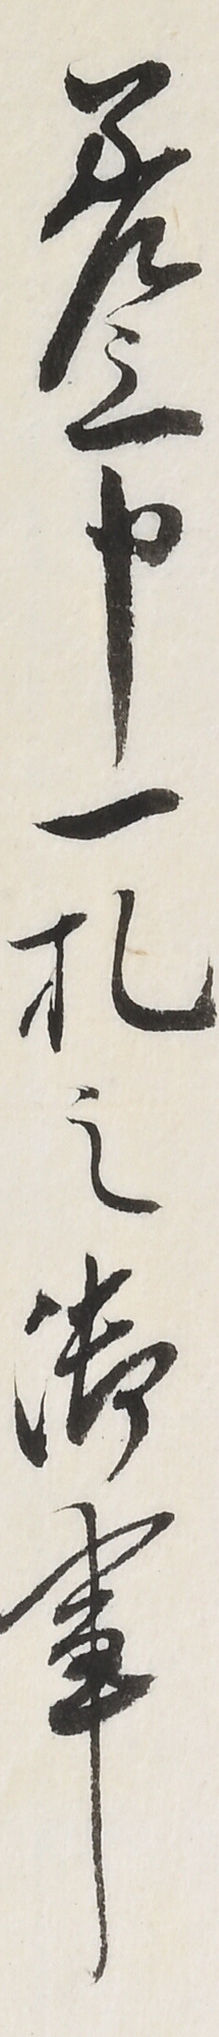差上申一札之御事
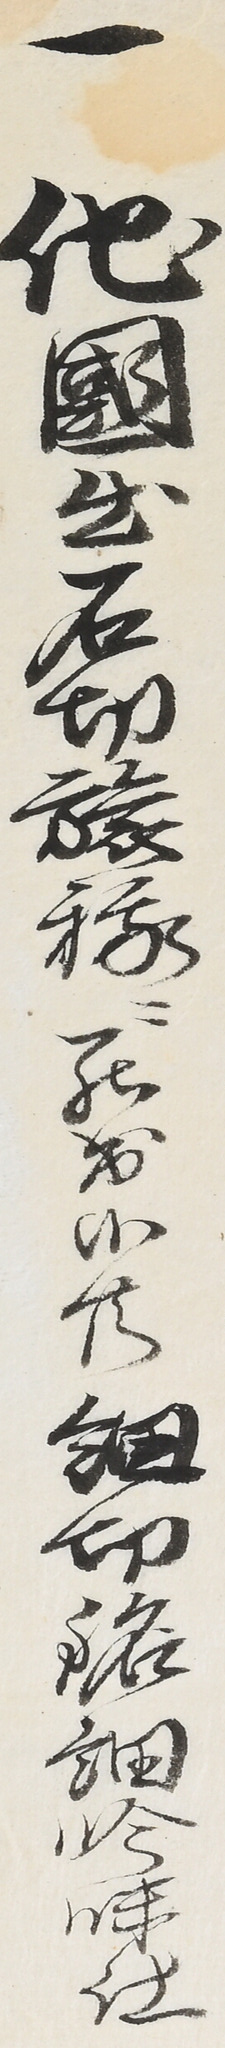一他國出石切旅稼ニ罷出候共細切銘細吟味仕
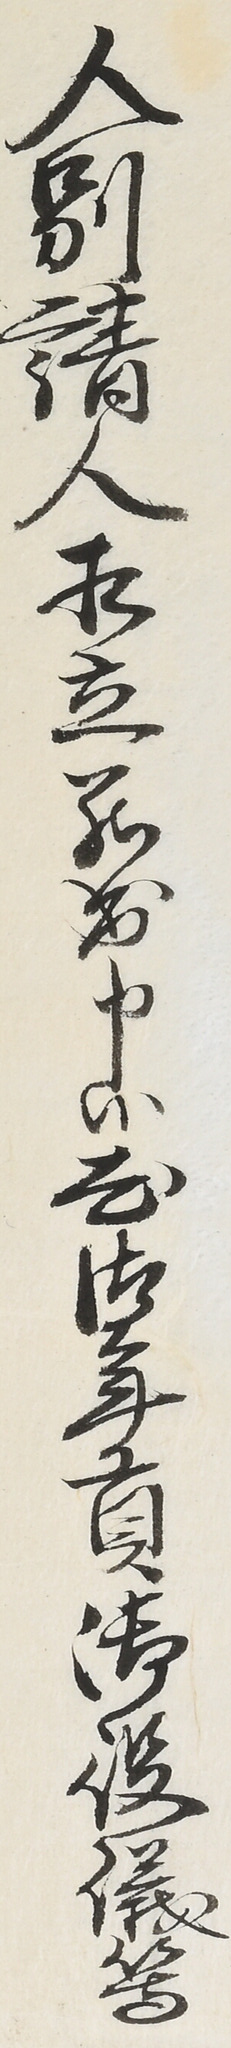人別請人相立罷出申候尤御年貢御役儀等
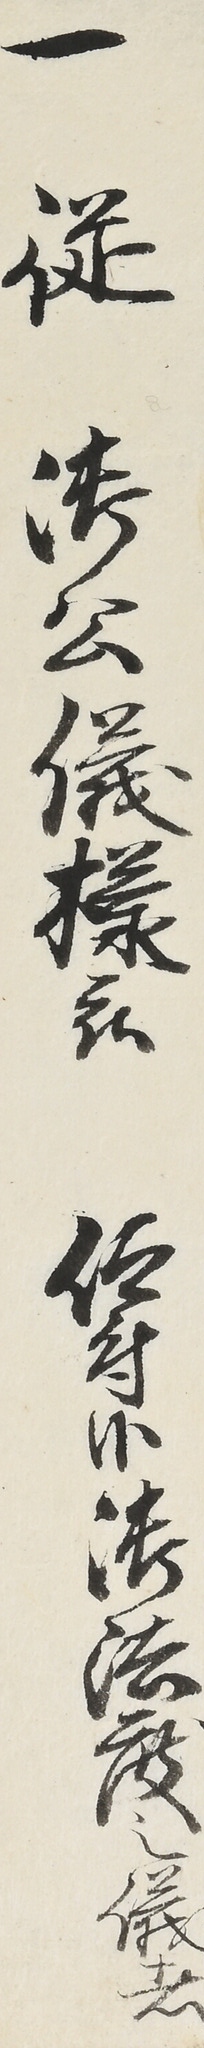一従御公儀様被仰付候御法度之儀者
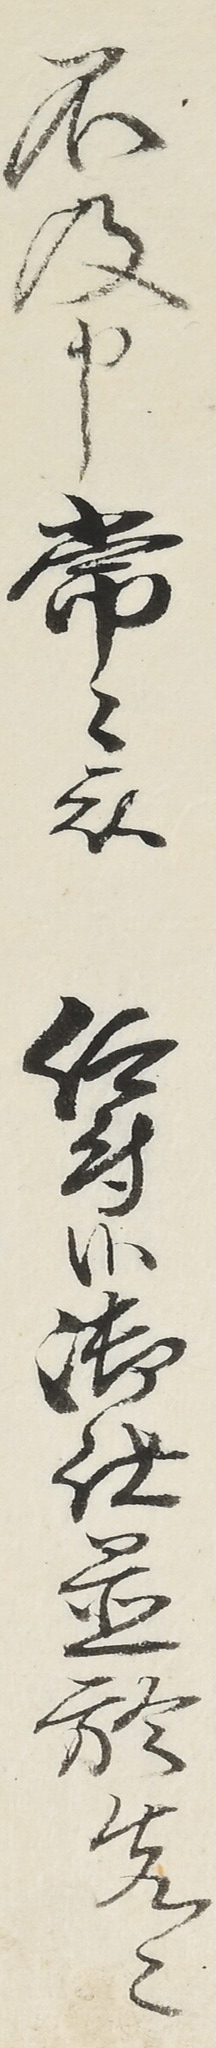不及申常々被仰付候御仕置於先々
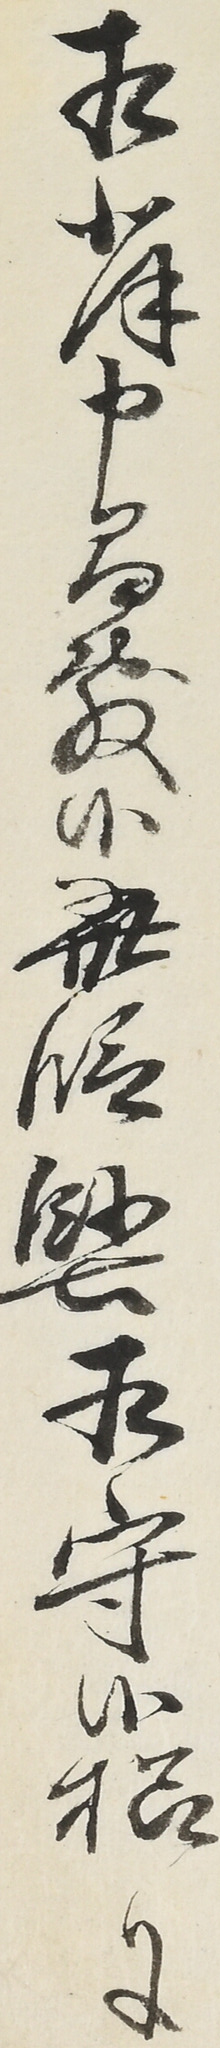相背申間敷候此段堅相守候様に

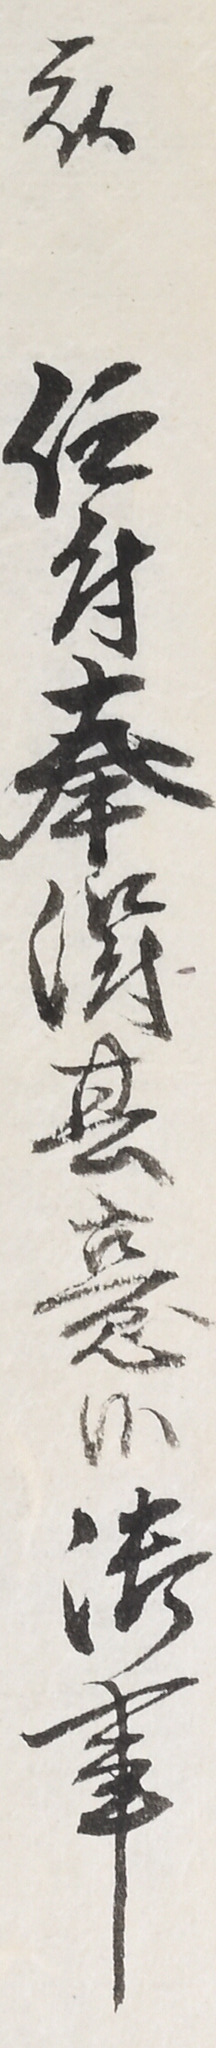被仰付奉得其意候御事
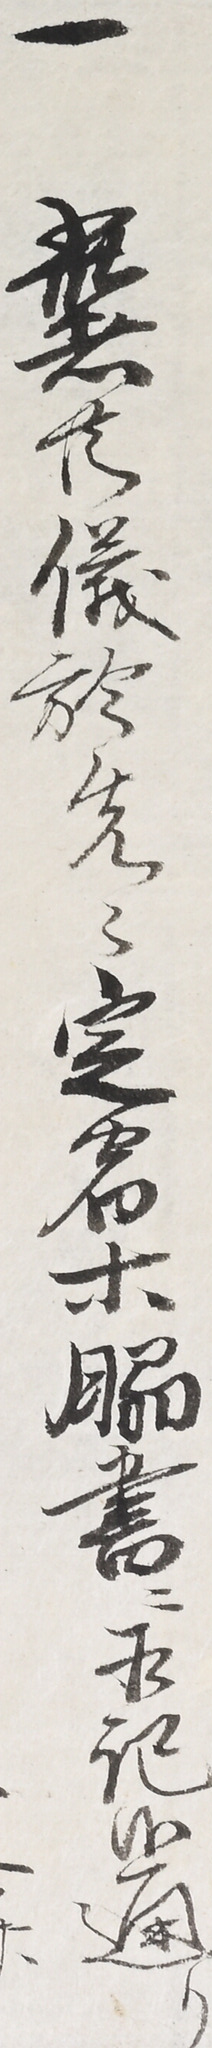一此者共儀於先々定宿等脇書相記候通り
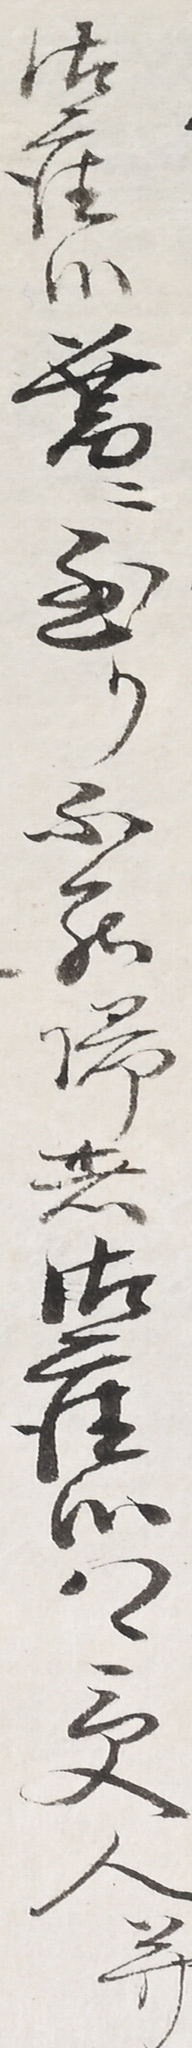御座候暮至り不罷帰者御座候ハヽ受人幷
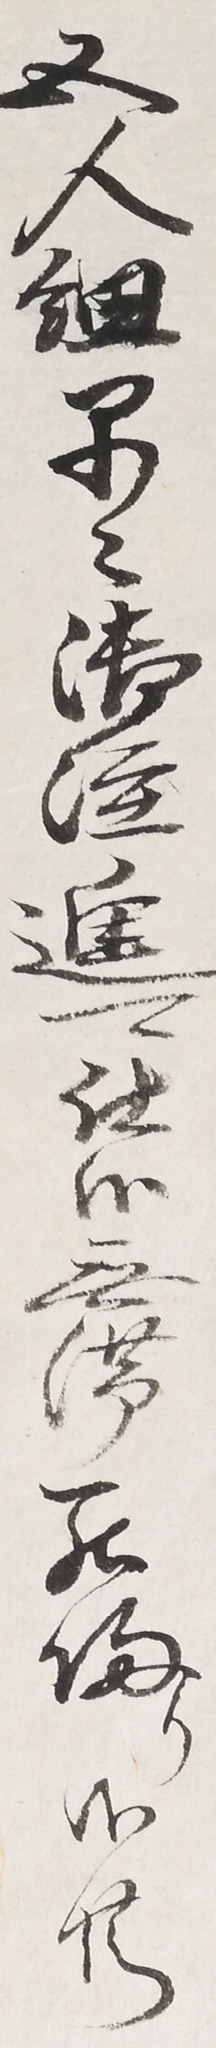五人組早々御注進可仕候無滞罷帰り候共
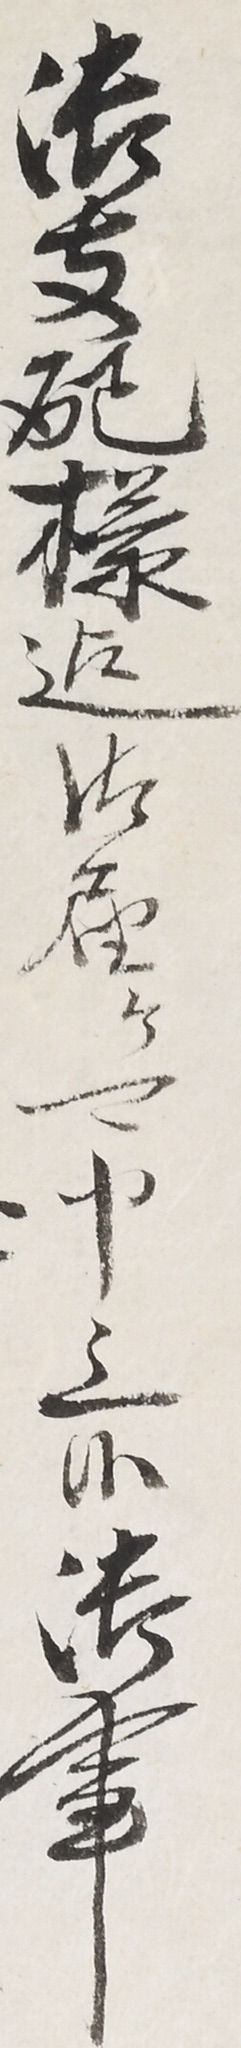御支配様迄御届可申上候御事
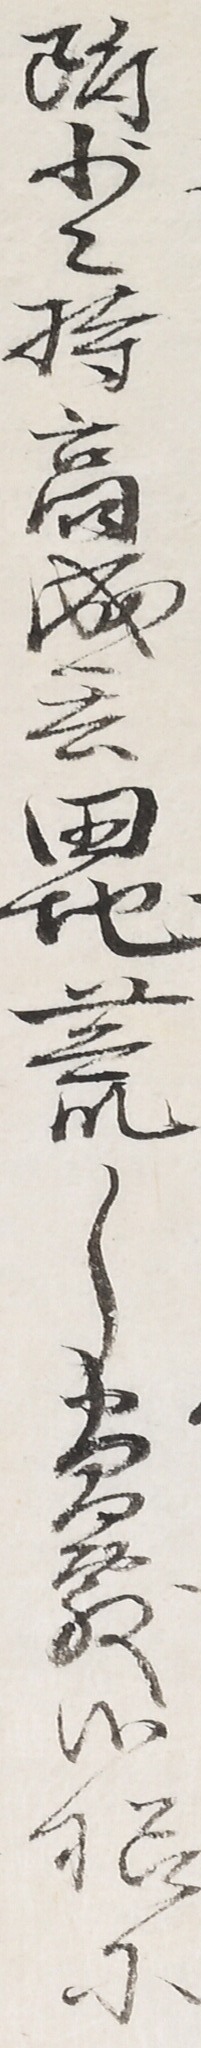附少々持高成共田地荒し申間敷候様に
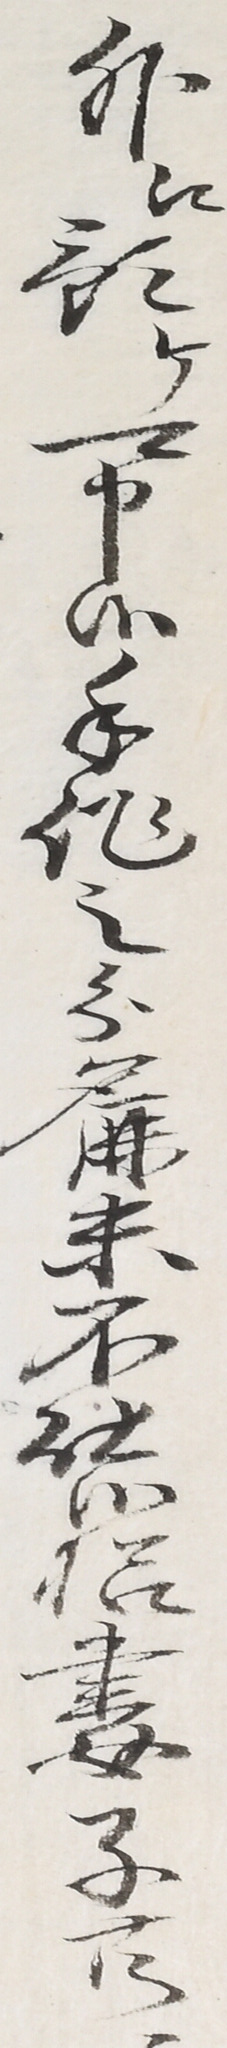外え預可申候手作之分麤末不仕候様妻子共
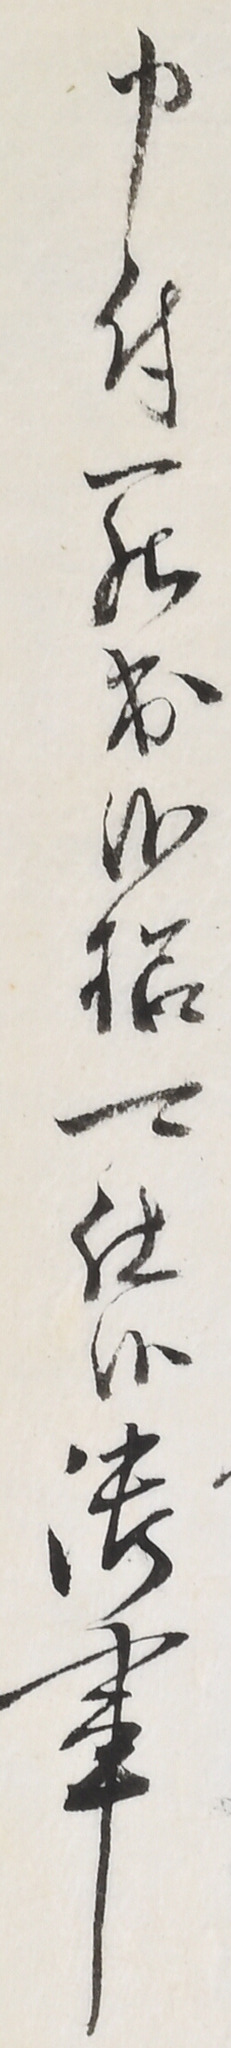申付罷出候様可仕候御事
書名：嘉永五壬子年二月他國出石切名前書上帳
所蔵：伊那市立高遠町図書館・合同会社AMANE
